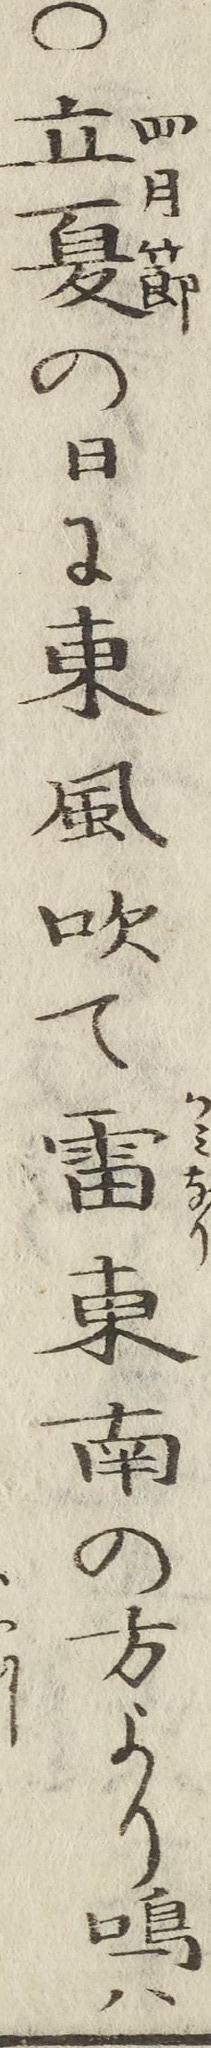〇立夏の日に東風吹て雷東南の方より鳴は
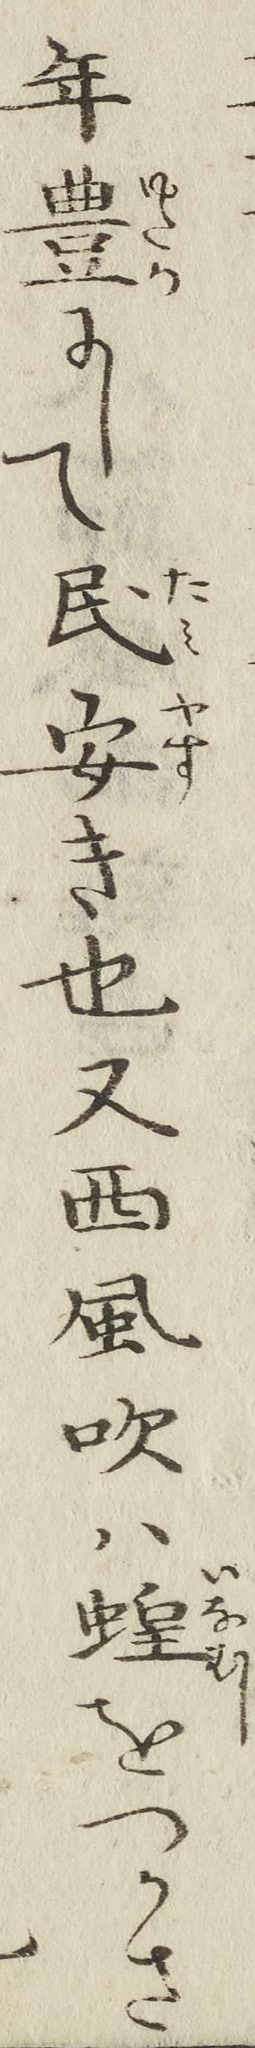年豊にして民安き也又西風吹は蝗をつかさ
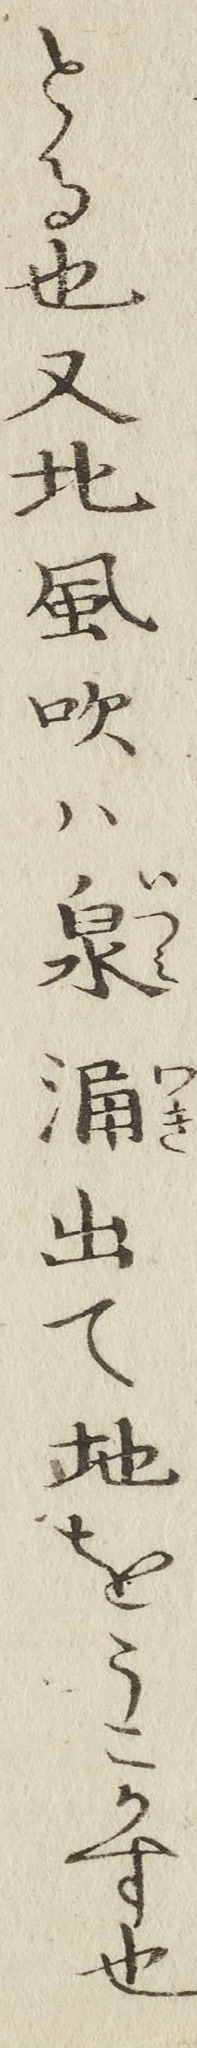とる也又北風吹は泉涌出て地をうこかす也
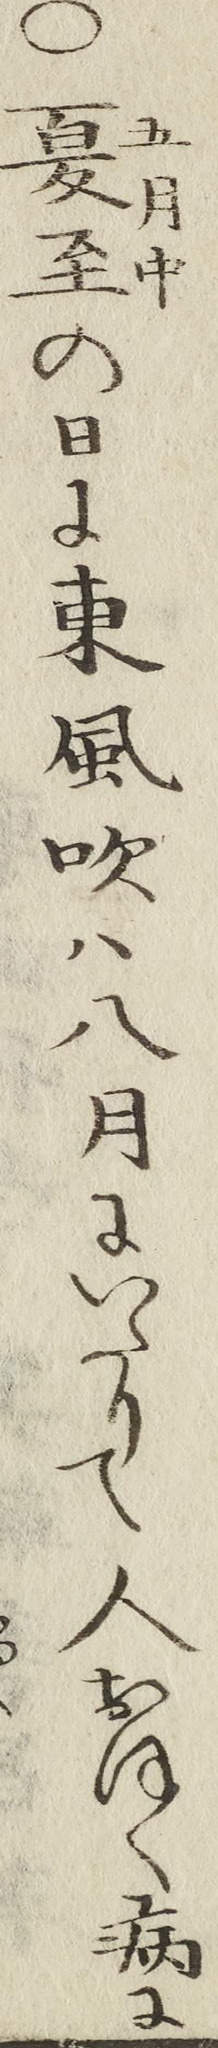〇夏至の日に東風吹は八月にいたりて人おほく病に
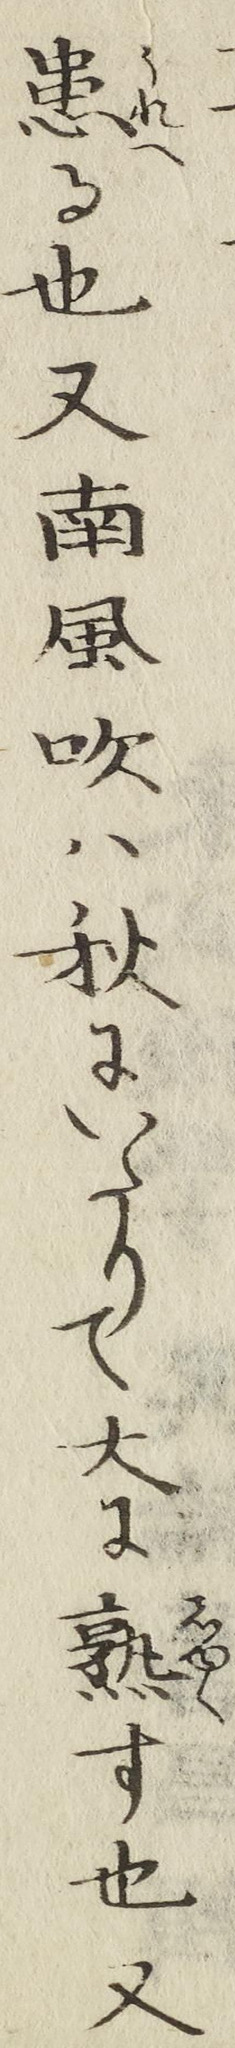患る也又南風吹は秋にいたりて大に熟す也又
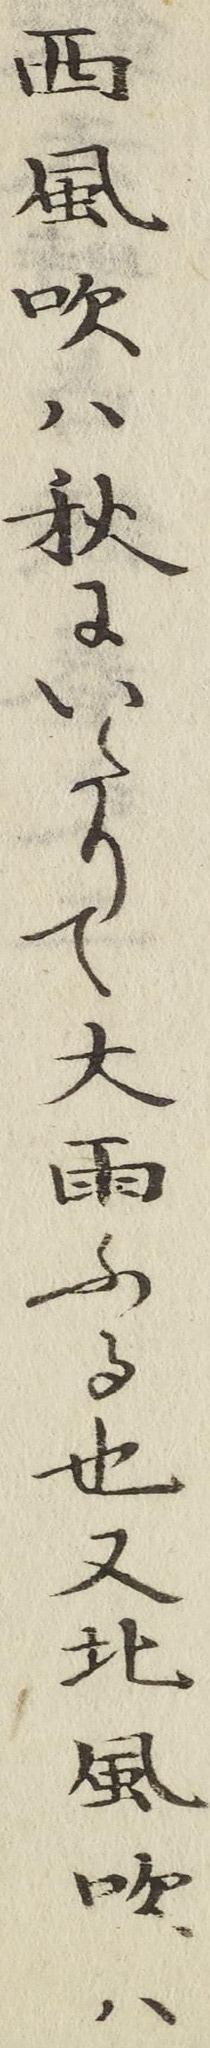西風吹は秋にいたりて大雨ふる也又北風吹は
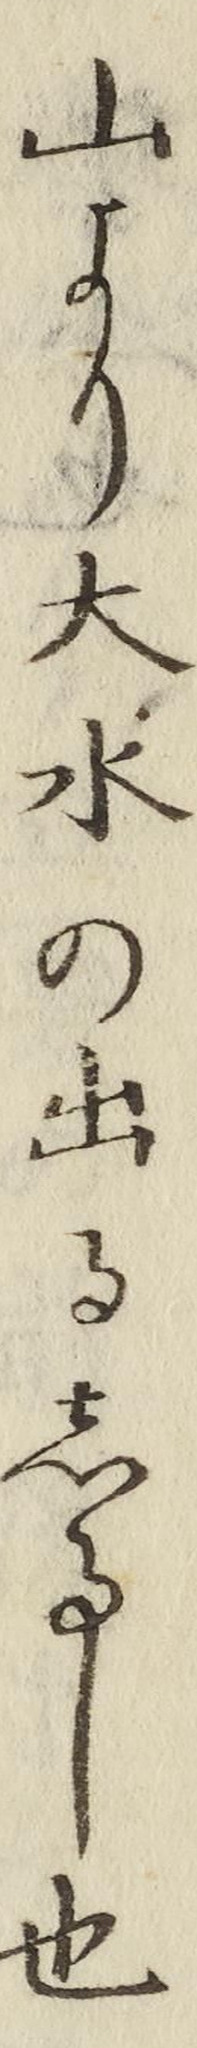山より大水の出るしるし也
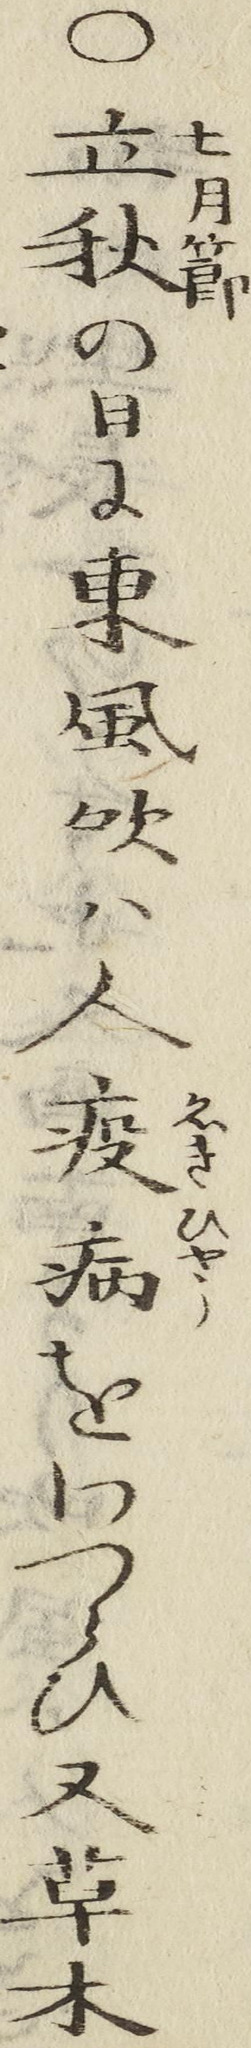〇立秋の日に東風吹は疫病をわつらひ又草木
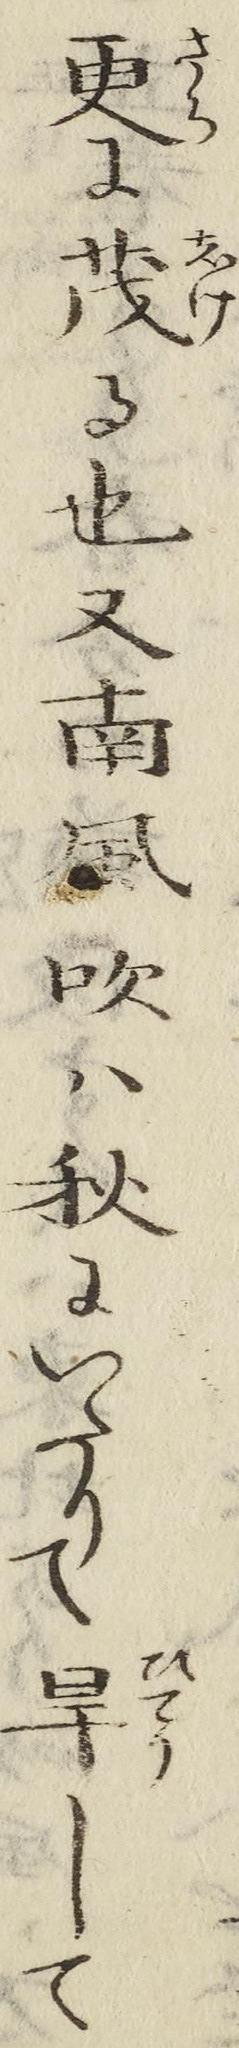更に茂る也又南風吹は秋にいたりて旱して
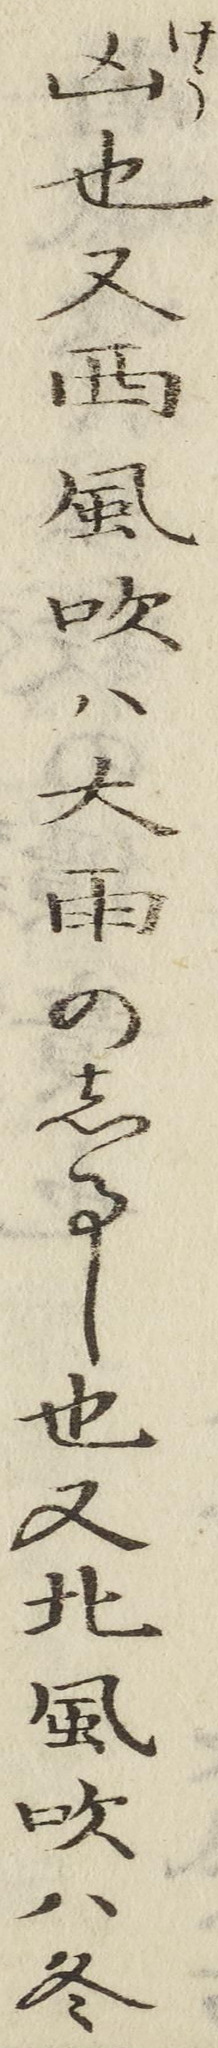凶也又西風吹は大雨のしるし也又北風吹は冬
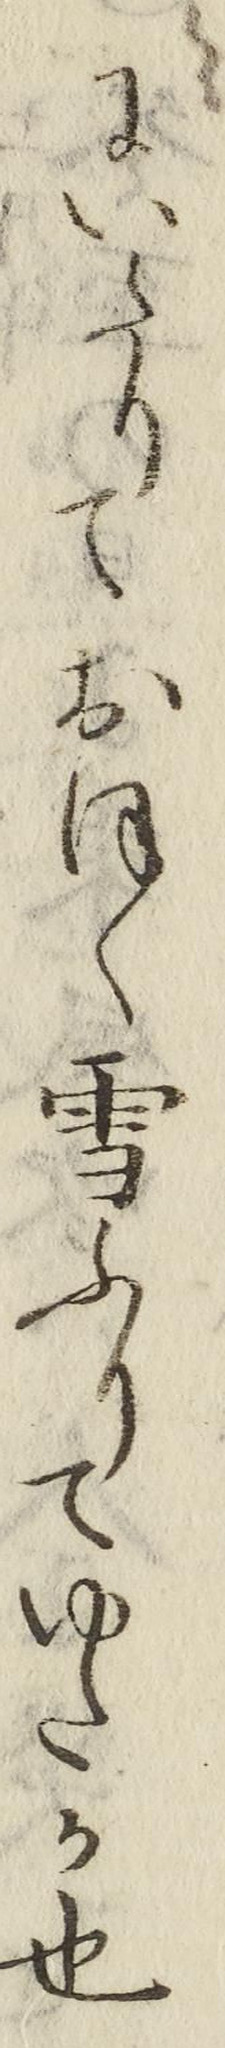にいたりておほく雪ふりてゆたか也
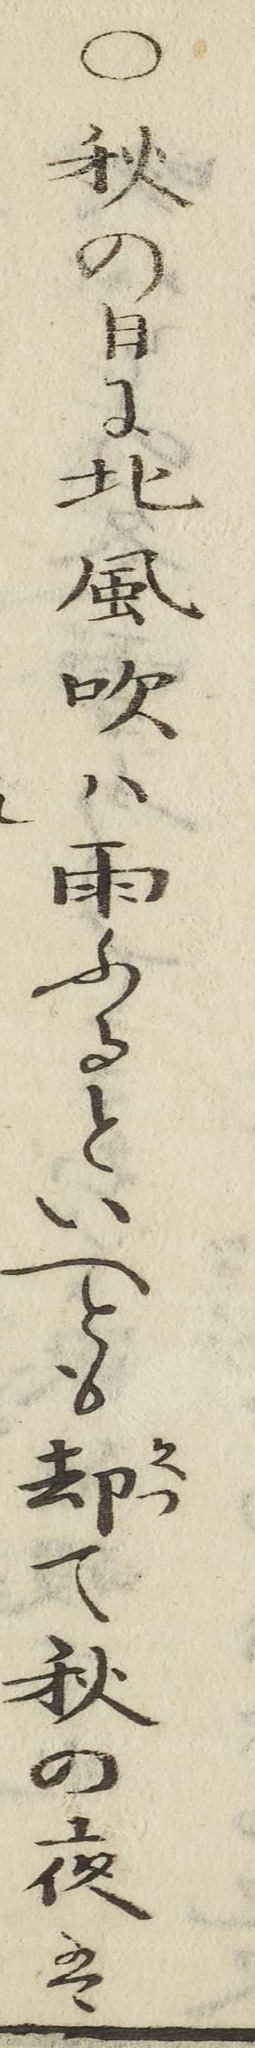〇秋の日に北風吹は雨ふるといへとも却て秋の夜は
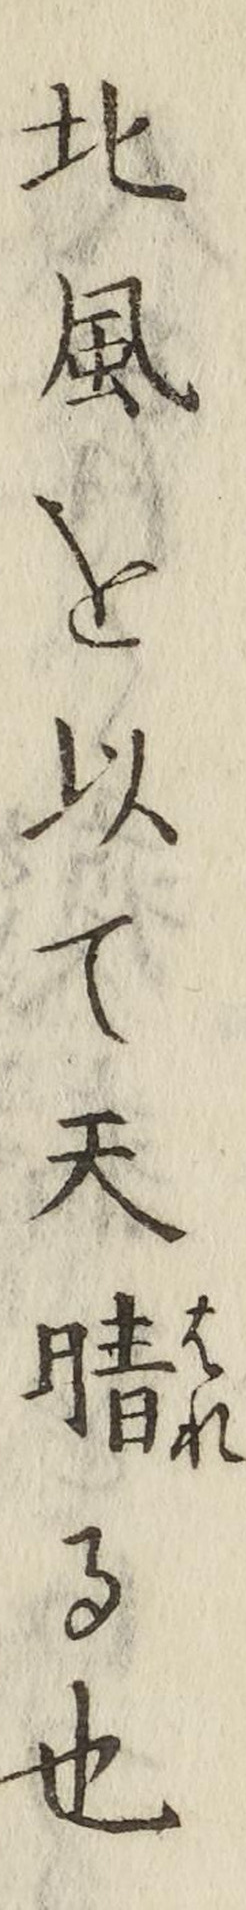北風を以て天晴る也
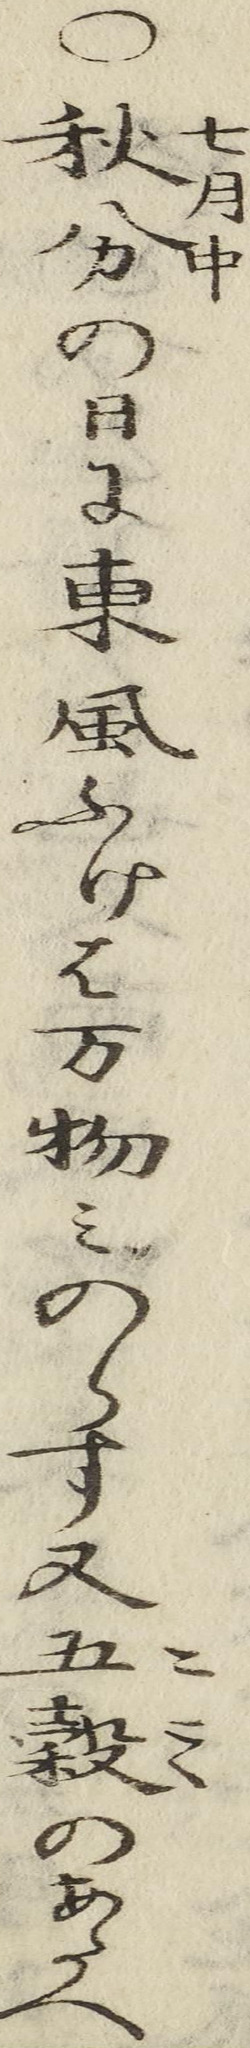〇秋分の日に東風ふけは万物みのらす又五穀のあたへ
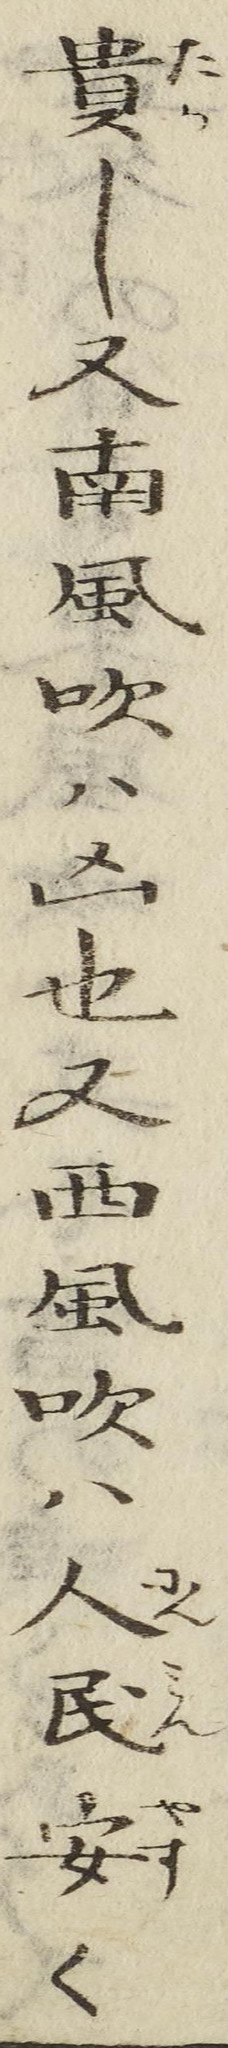貴し又南風吹は凶也又西風吹は人民安く
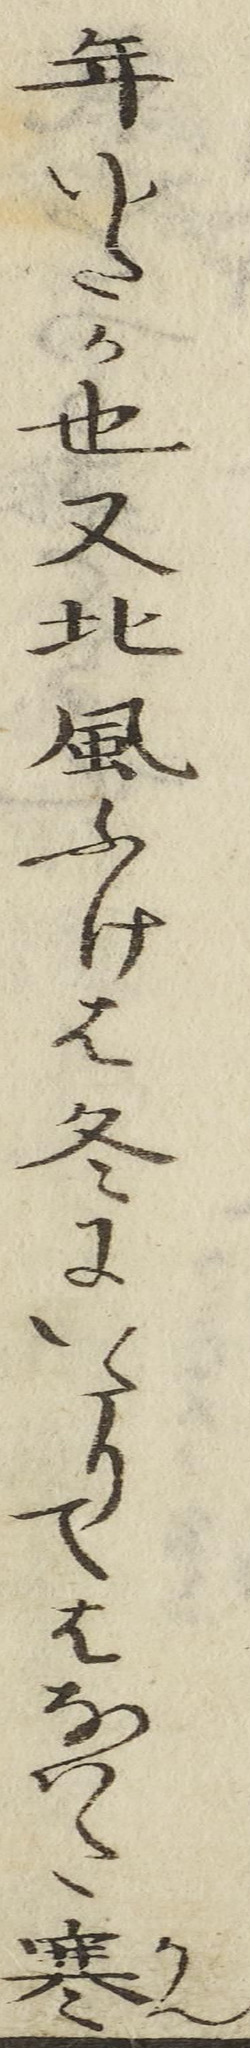年ゆたか也又北風ふけは冬にいたりてはなはた寒
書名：天時占候　二
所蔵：東京大学地震研究所図書室 Earthquake Research Institute Library, The University of Tokyo, JAPAN
